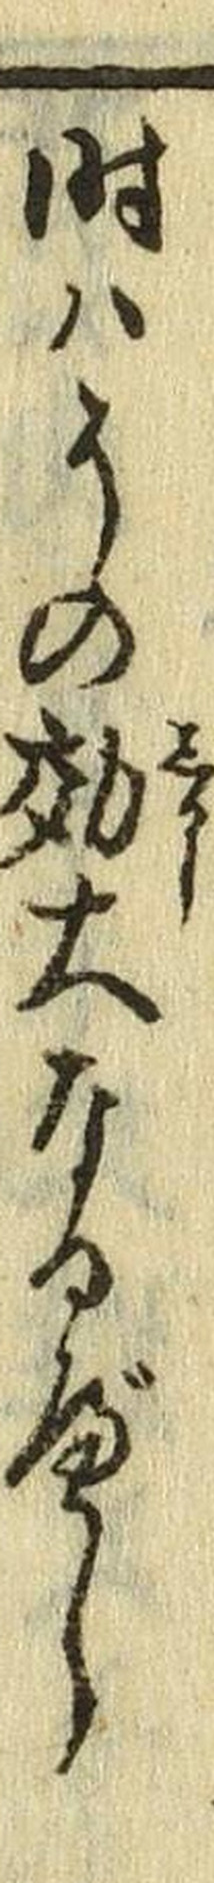時はその効大なるべし
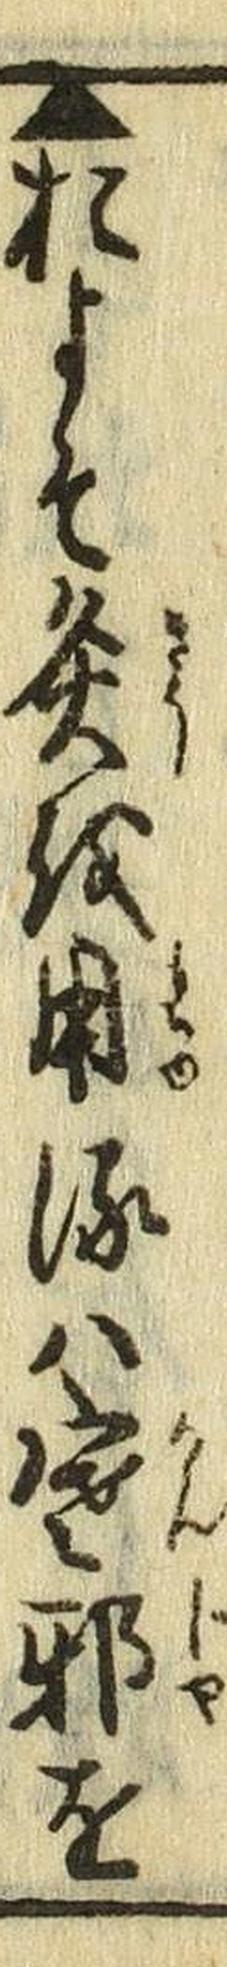▲およそ灸を用るは寒邪を
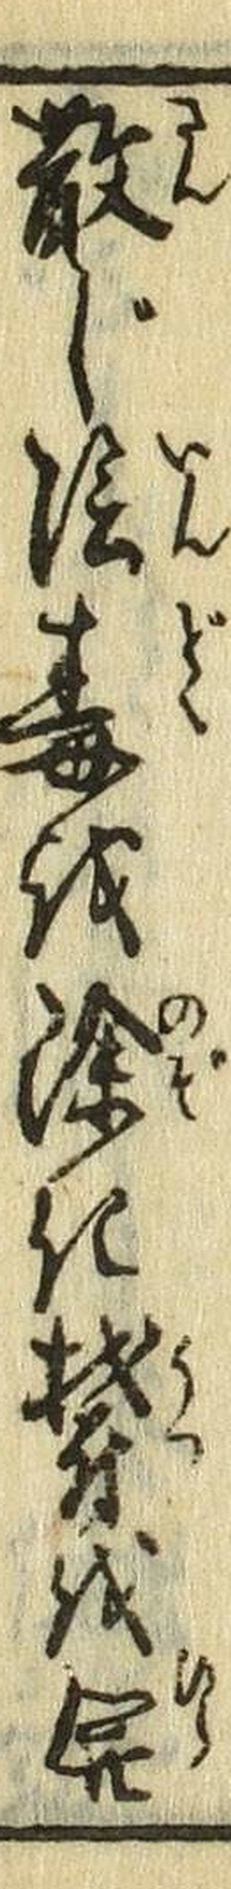散じ陰毒を除き鬱を開
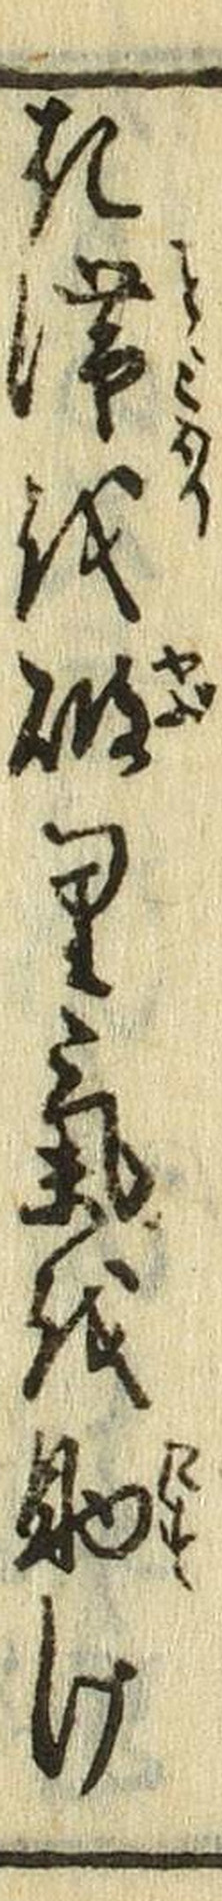き滞を破り気を助け
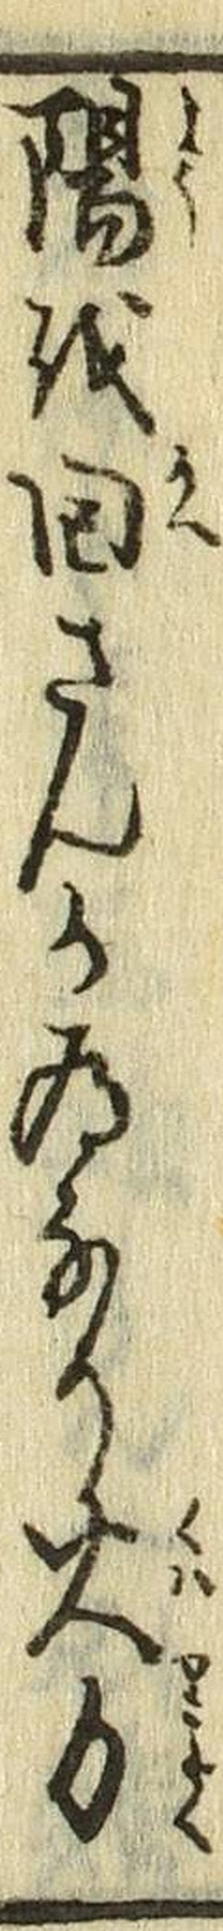陽を回さんか為なり火力
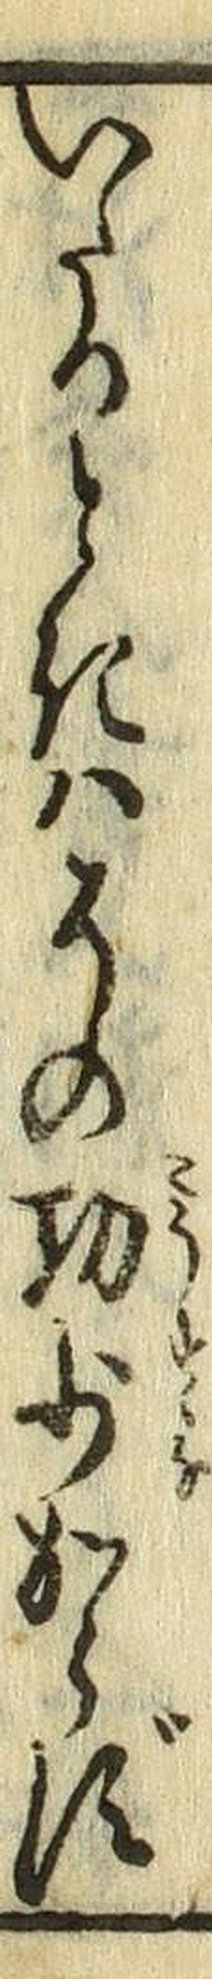いたるときはその功少からず
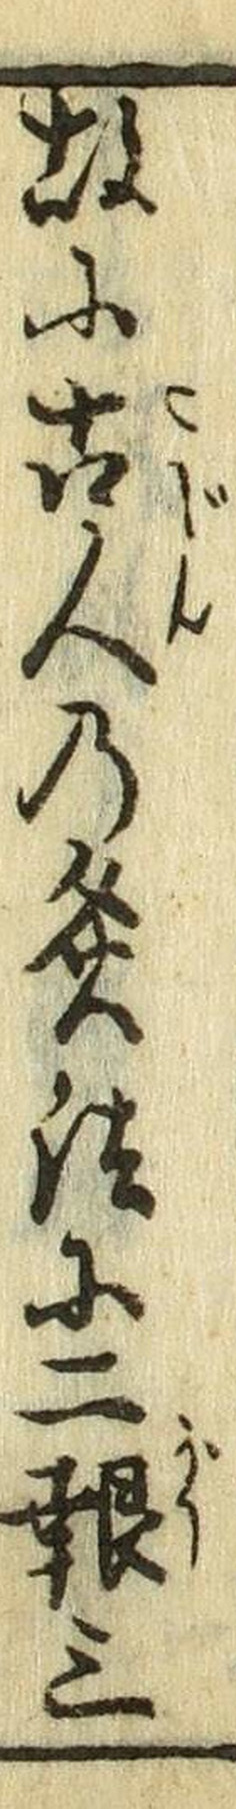故に古人の灸法に二報三
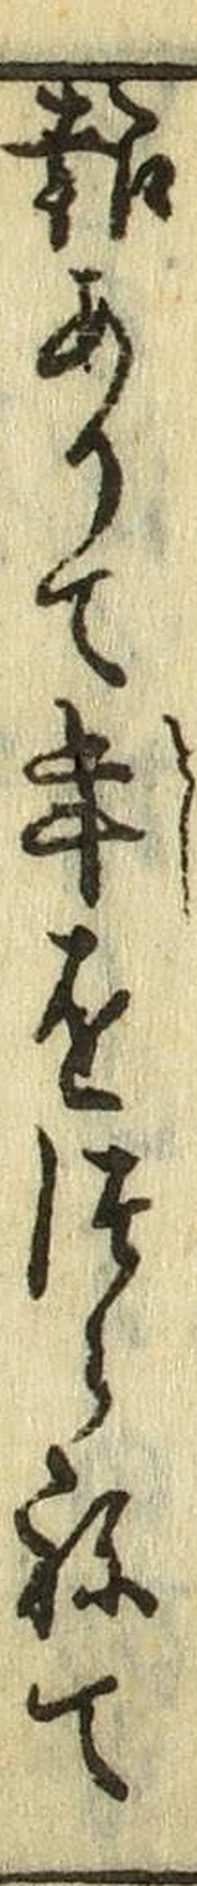報ありて年をつらねて
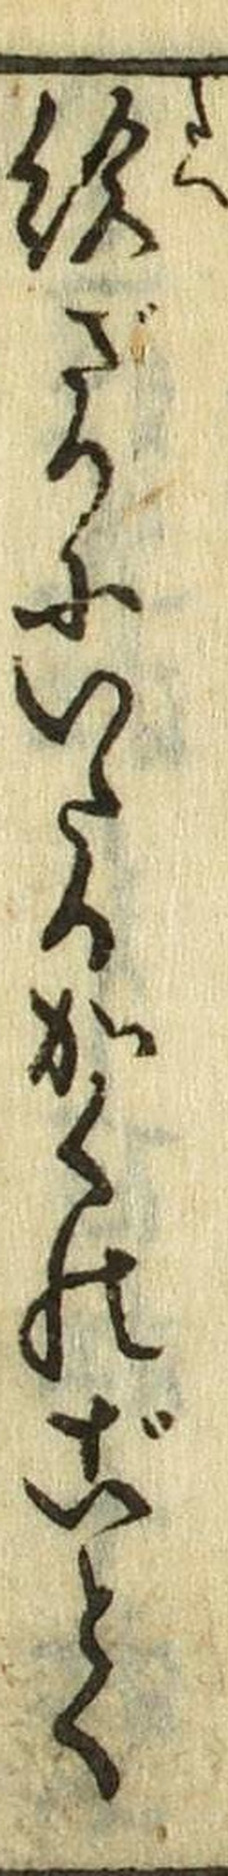絶ざるにいたるかくのごとく
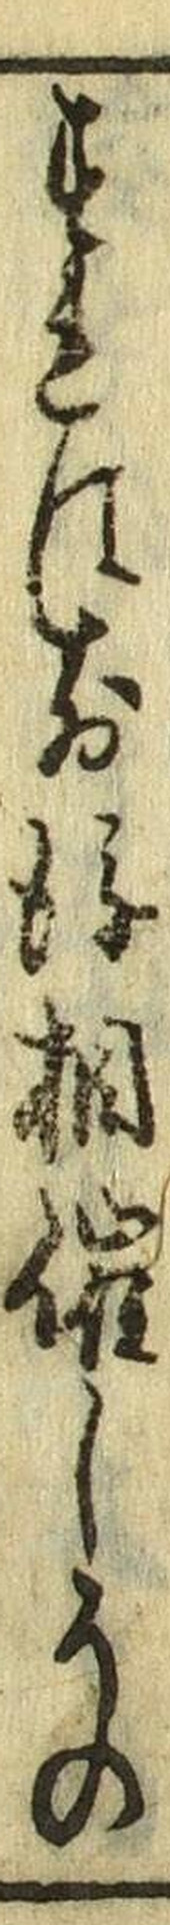すれは前後相催しその

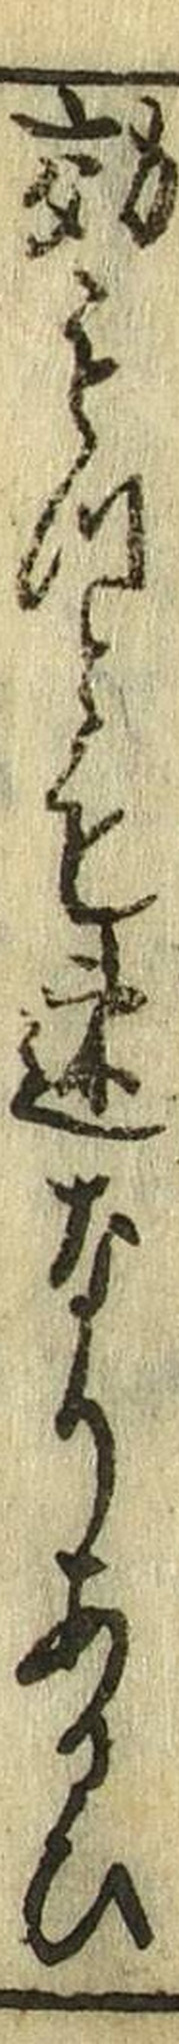効もつとも速なりあるひ
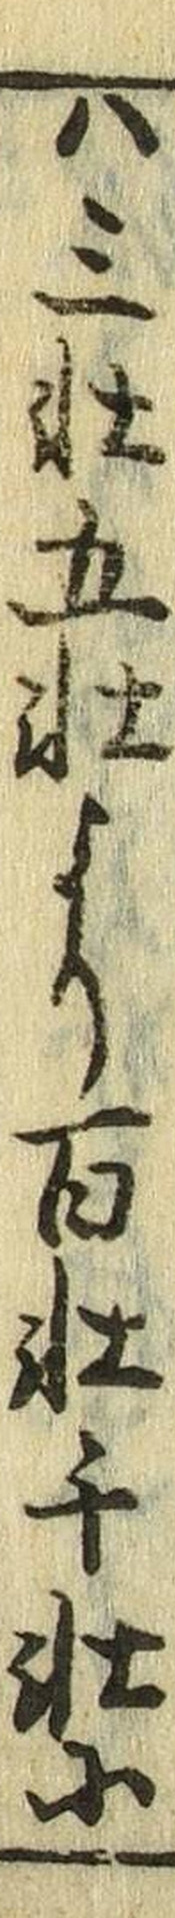は三壮五壮より百壮千壮に
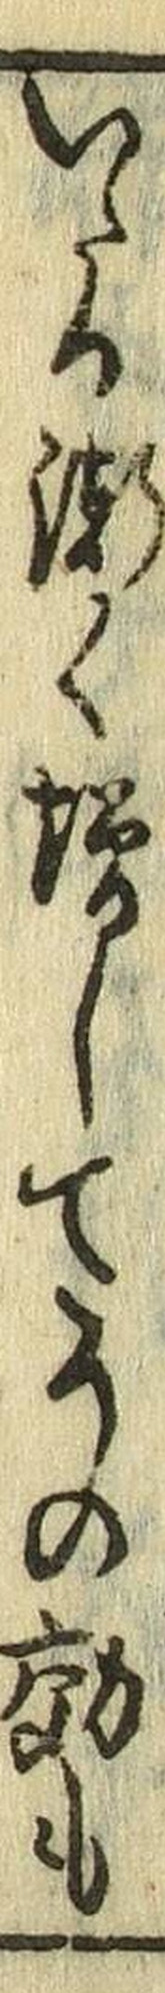いたる漸く増してその効も
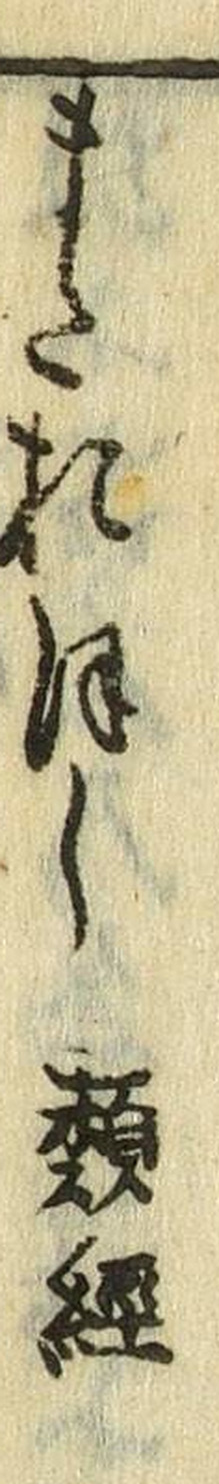またおほし類経
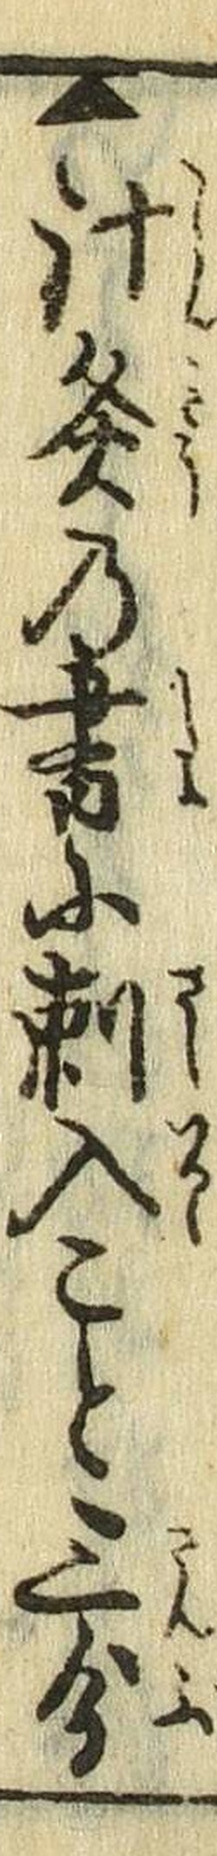▲針灸の書に刺入こと三分
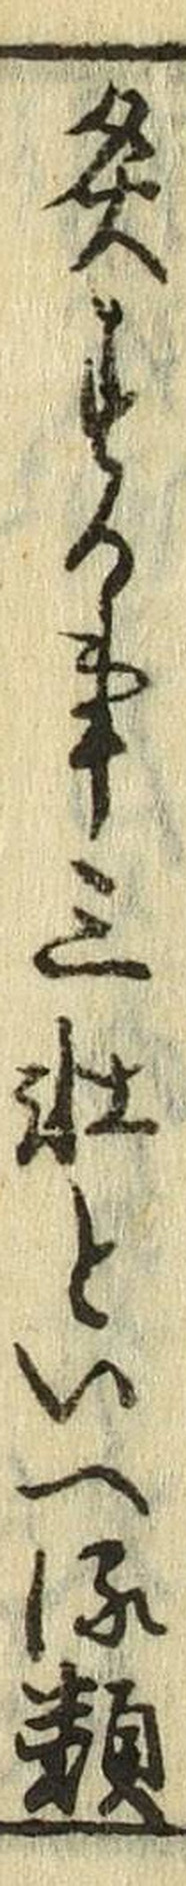灸する事三壮といへる類
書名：居家養生記
